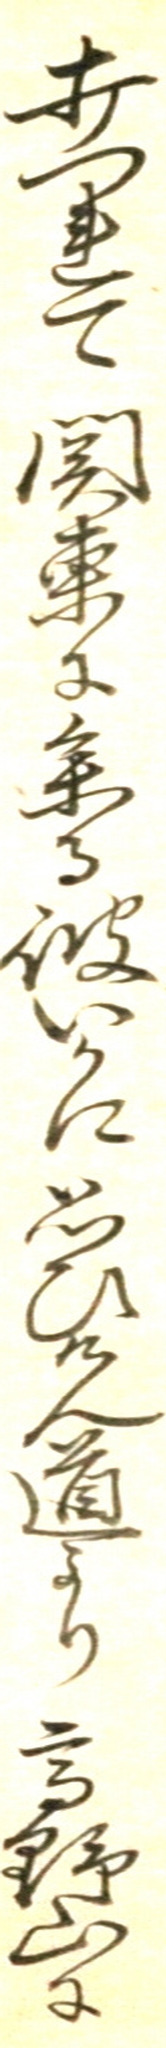打つれて関東に参る彼いかに思ひけん道より高野山に
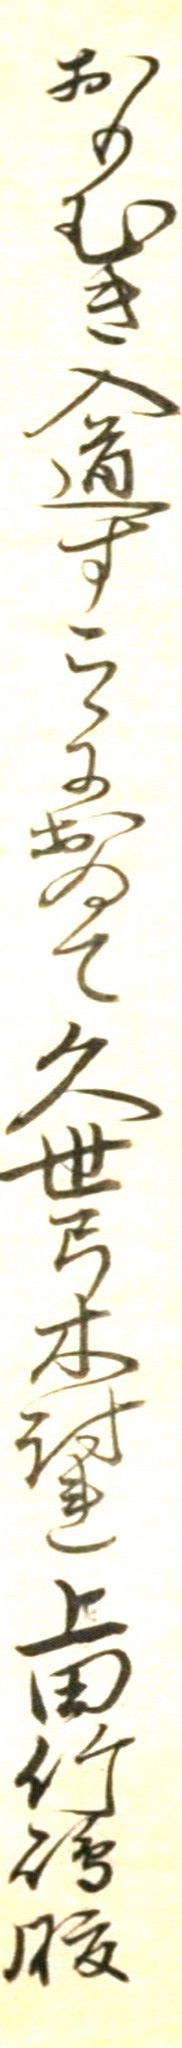おもむき入道すこゝにおゐて久世弓木討れ上田竹島腹
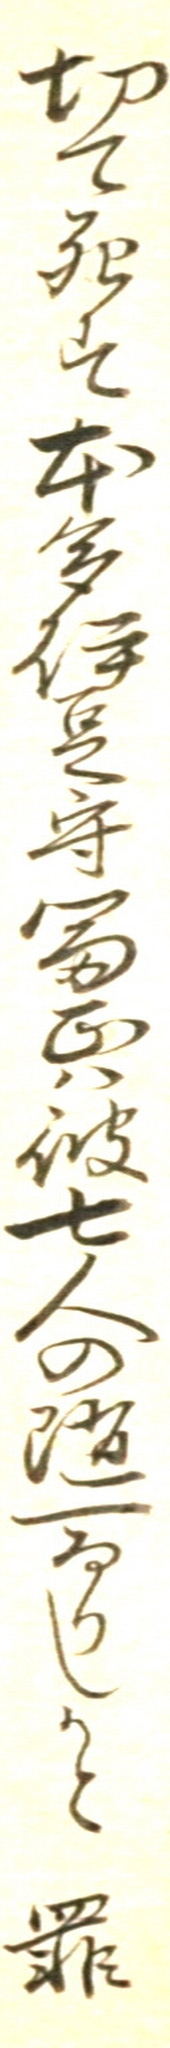切て死す本多伊豆守富正は彼七人の随一なりしかと罪
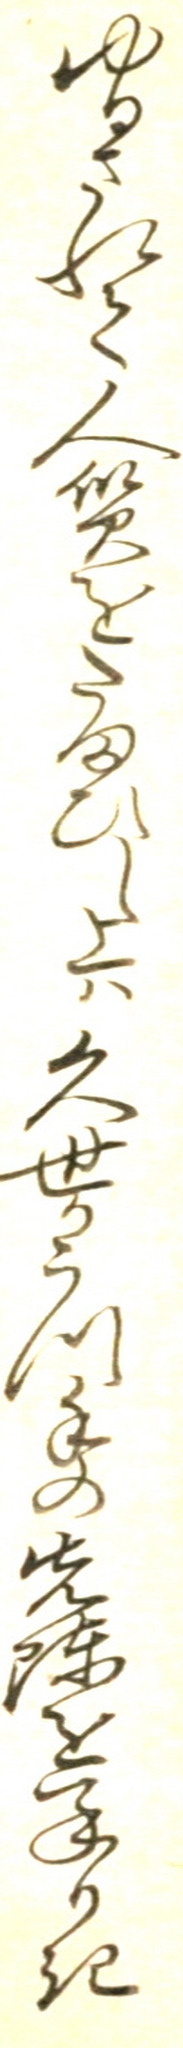ゆるされて人質をたまひし上は久世かうつ手の先陣を承りき
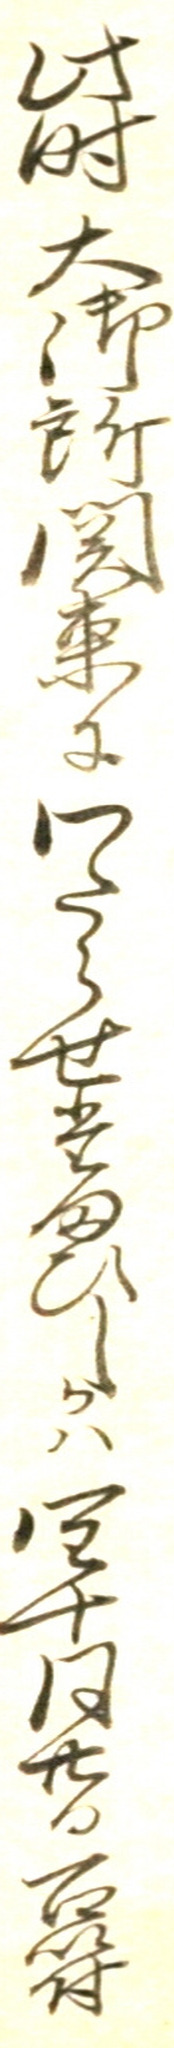此時大御所関東にわたらせたまひしかは閏十月廿日召符
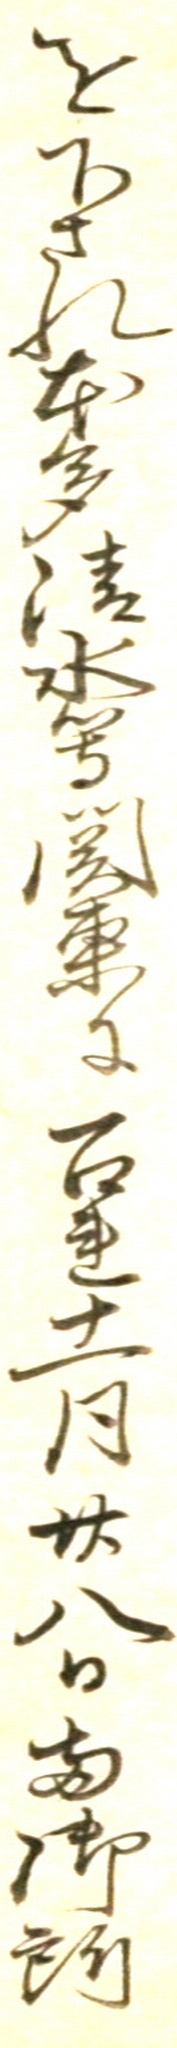を下され本多清水等関東に召れ十一月廿八日両御所
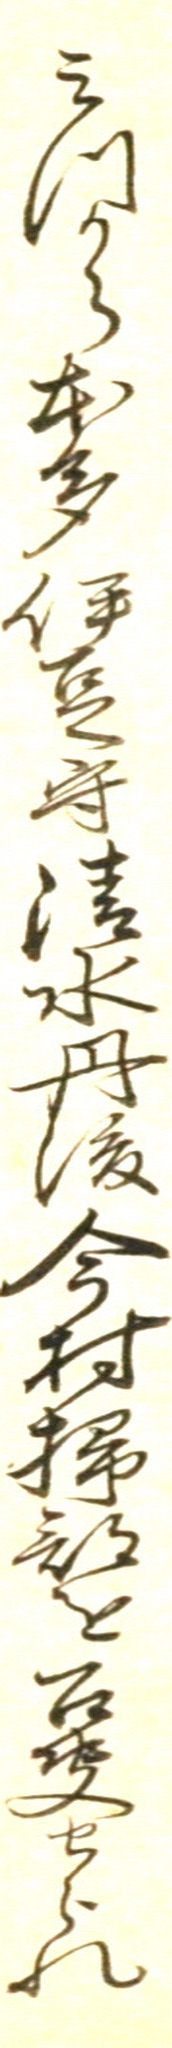みつから本多伊豆守清水丹後今村掃部を召決せられ
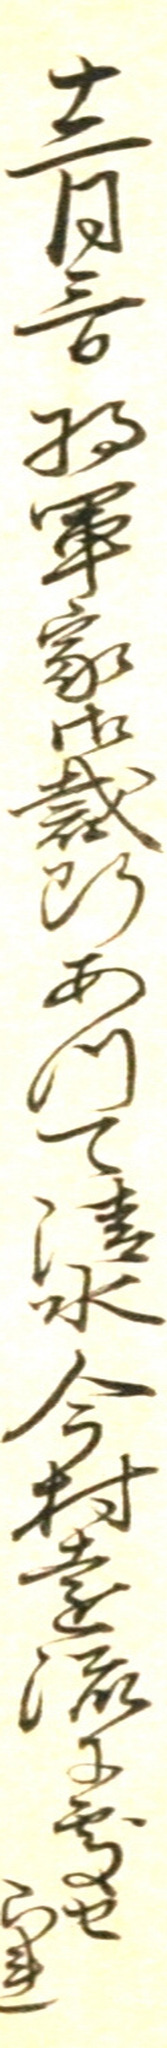十二月三日将軍家御裁断あつて清水今村遠流に処せられ
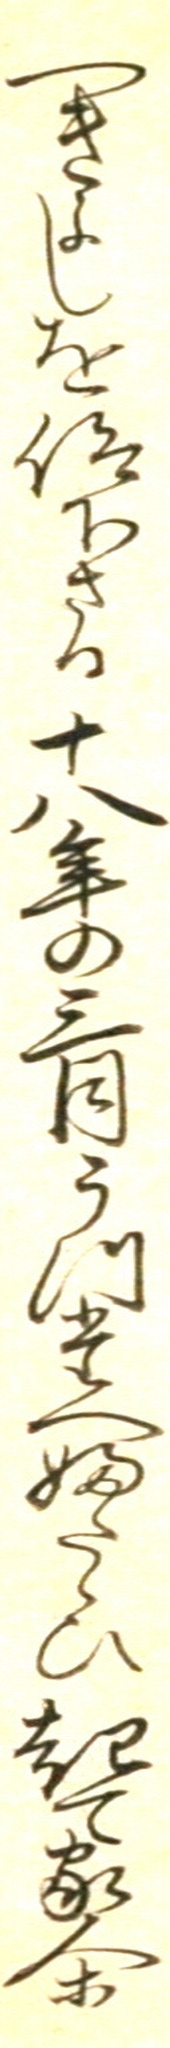へきよしを仰下さる十八年の三月うつたへふたゝひ起て家人等
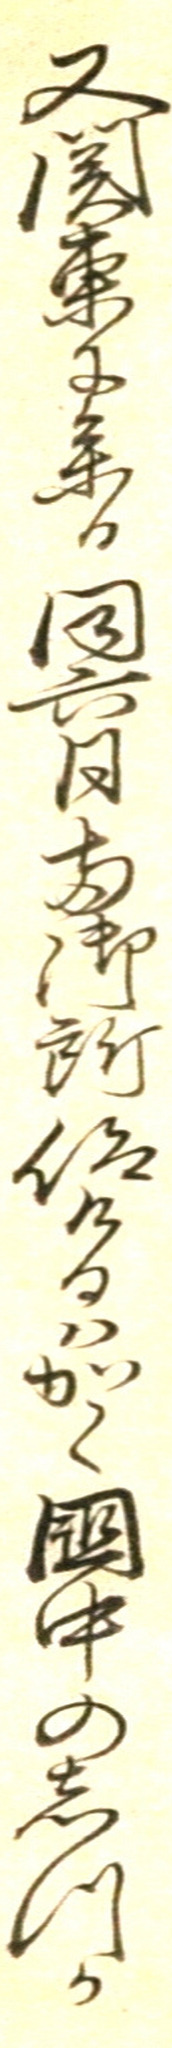又関東に参る同六月両御所仰けるはかく国中のしつか
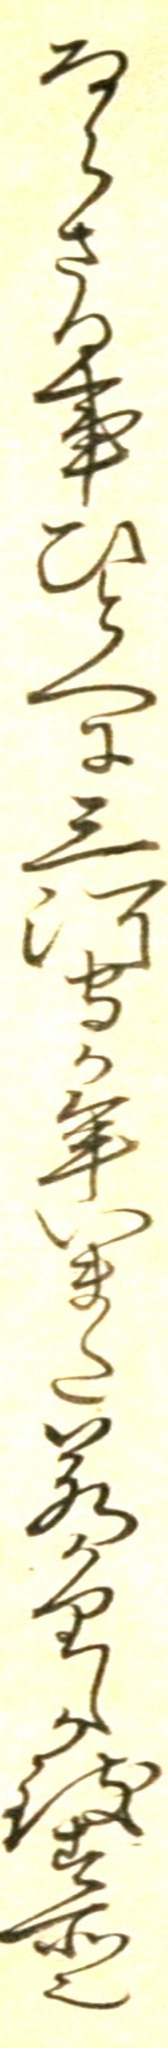ならさる事ひとへに三河守か年いまた若かりしか致す所也
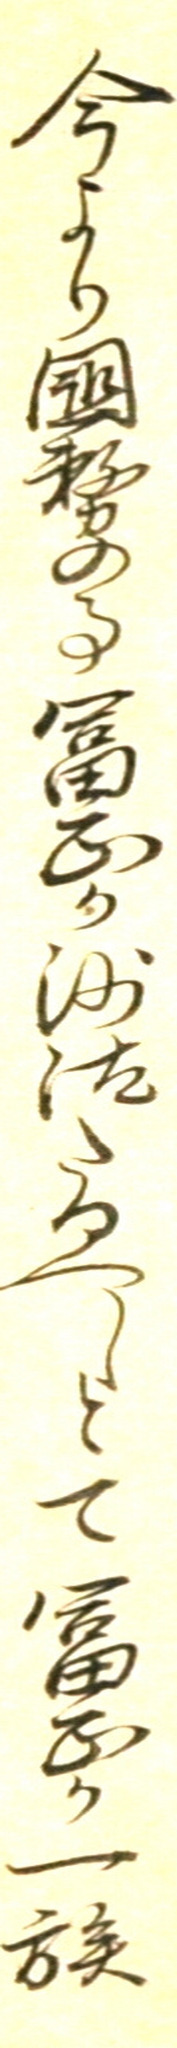今より国務の事富正か沙汰たるへしとて富正か一族

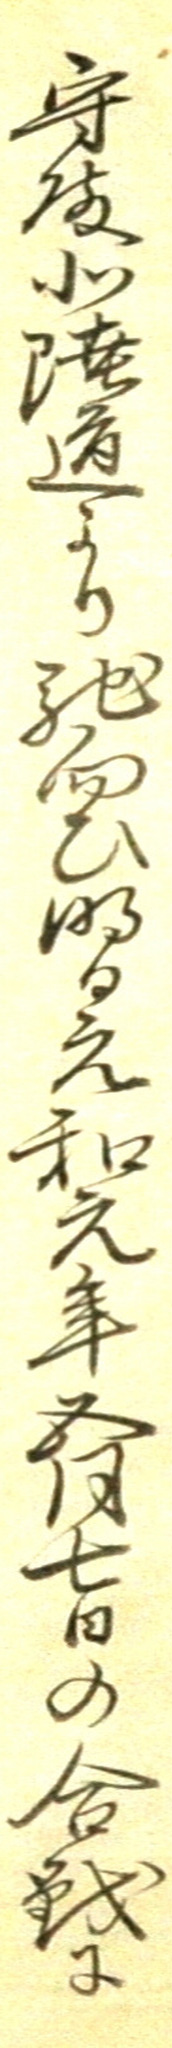守殿北陸道より馳向ひ明る元和元年五月七日の合戦に
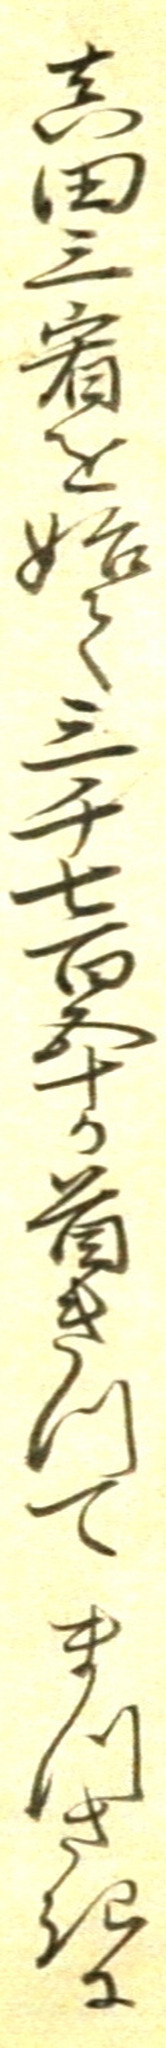真田三宥を始て三千七百五十か首きつてまつさきに
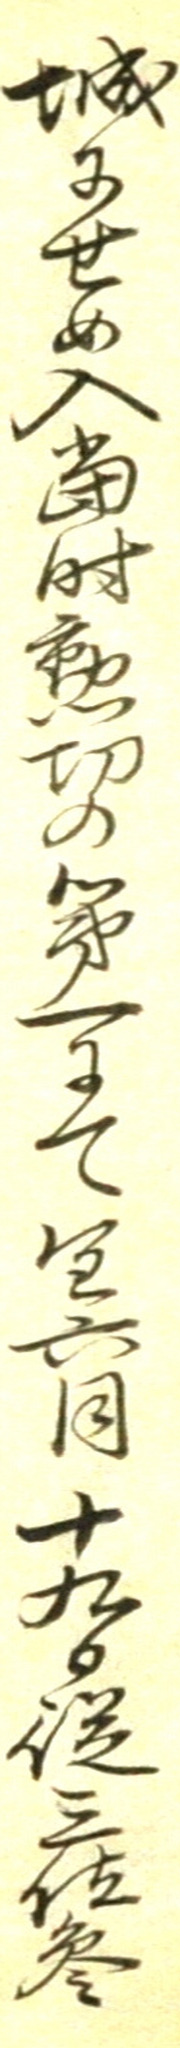城にせめ入当時勲功の第一にて閏六月十九日従三位参
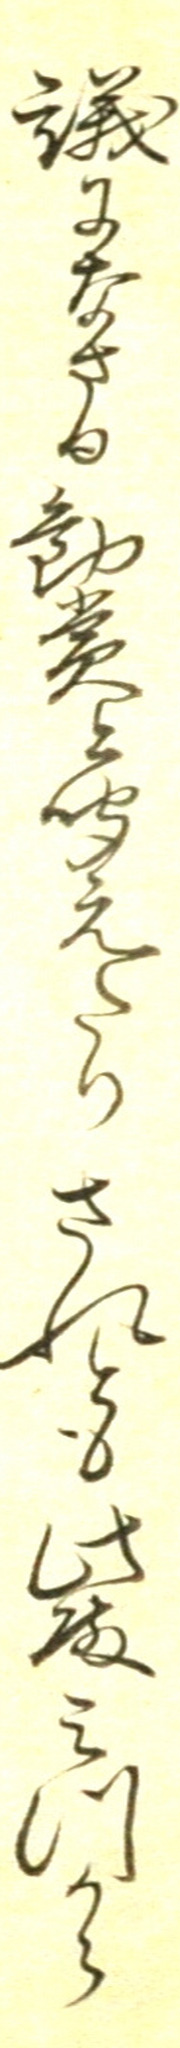議になさる勧賞と聞えたりされとも此殿みつから
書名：藩翰譜（一）
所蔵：伊那市立高遠町図書館・合同会社AMANE
